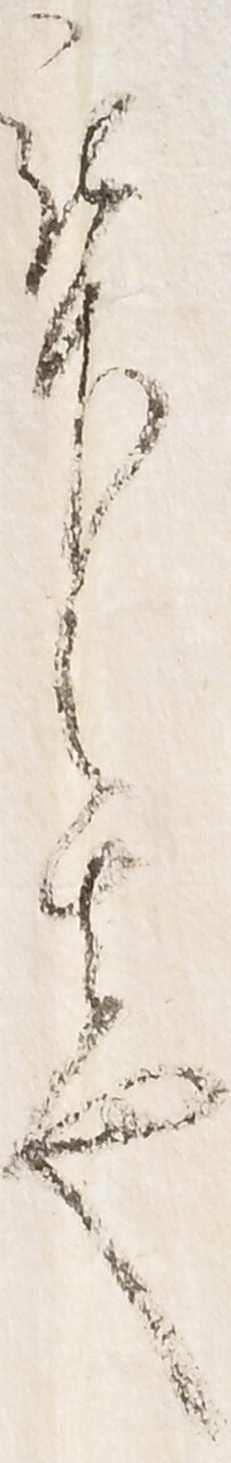被下候者也
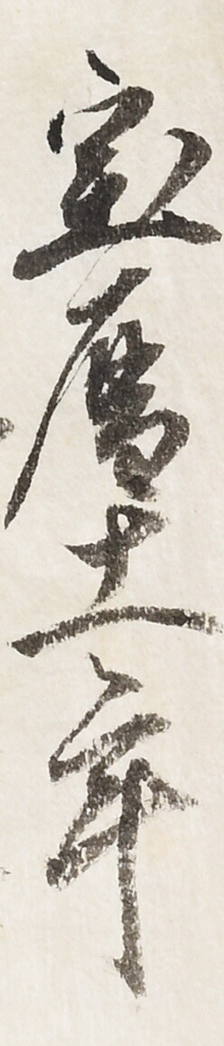宝暦十一年
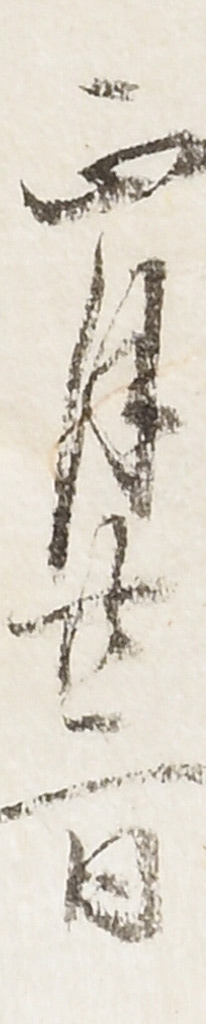正月廿二日
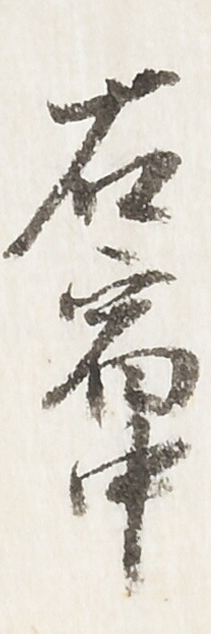右宿中
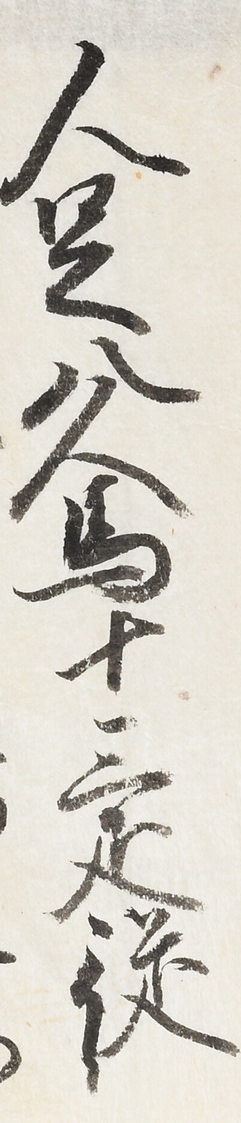人足八人馬十三疋従
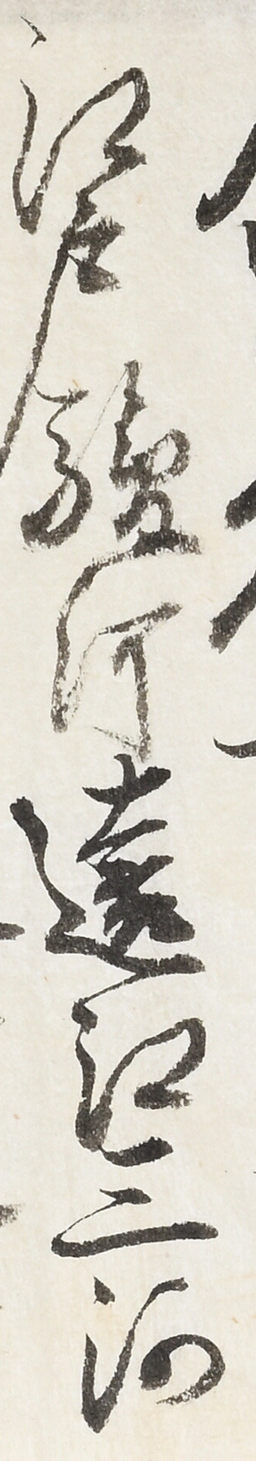江戸駿河遠江三河
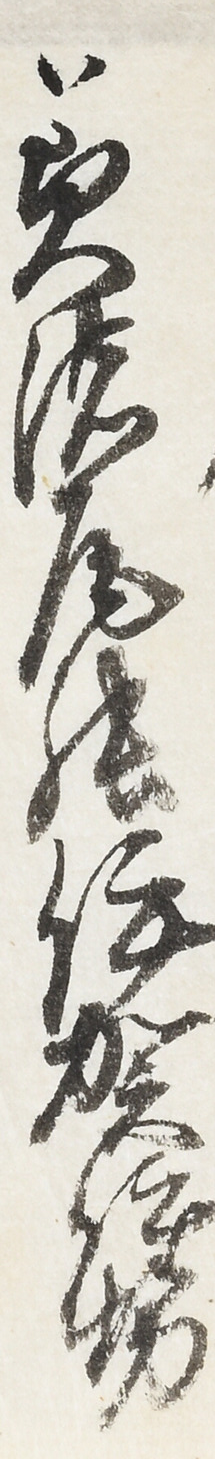美濃尾張伊賀伊勢
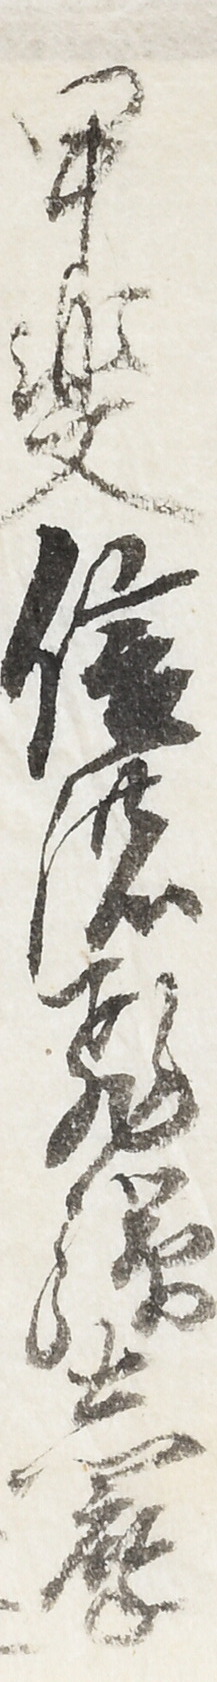甲斐信濃飛騨志摩
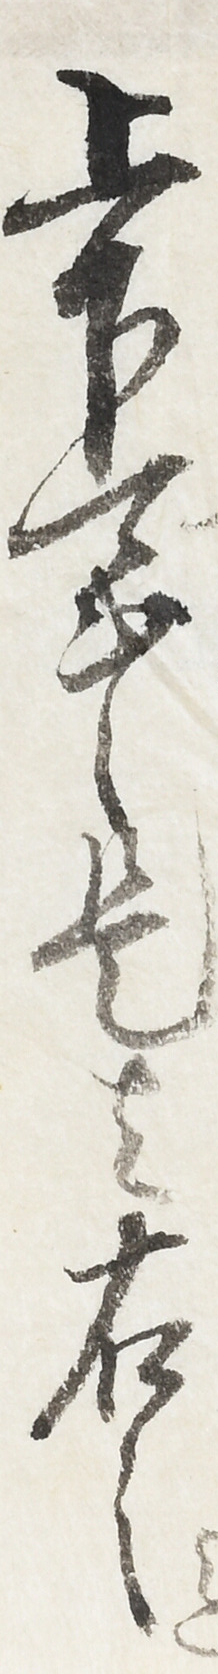上下可出之是者右之
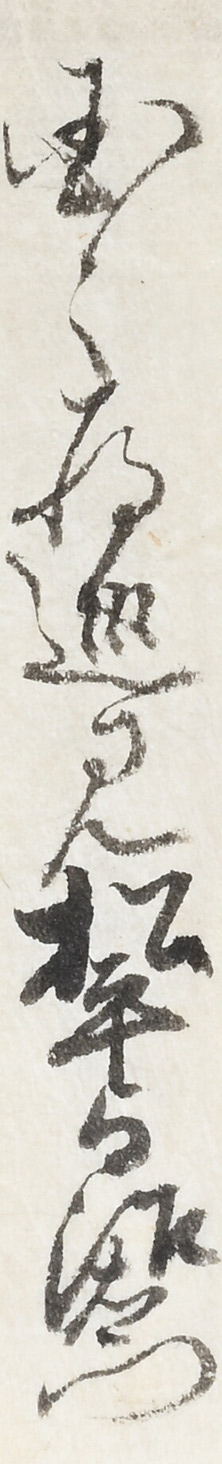国々為巡見松平与治右衛門

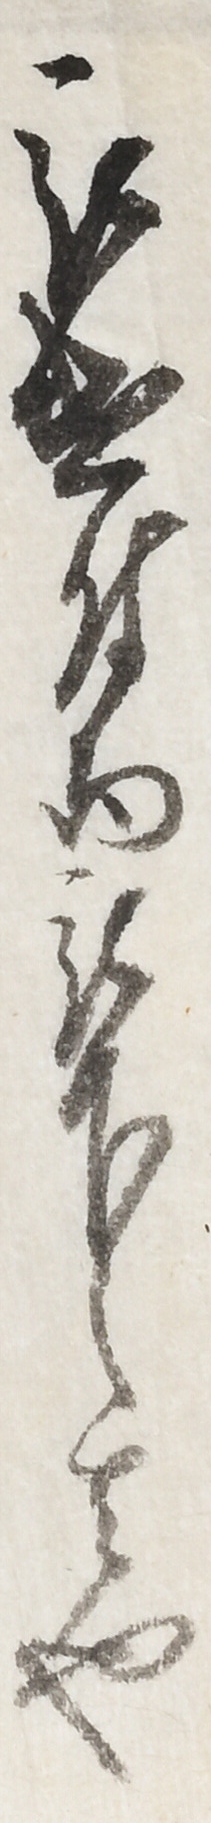被遣付而被下候者也
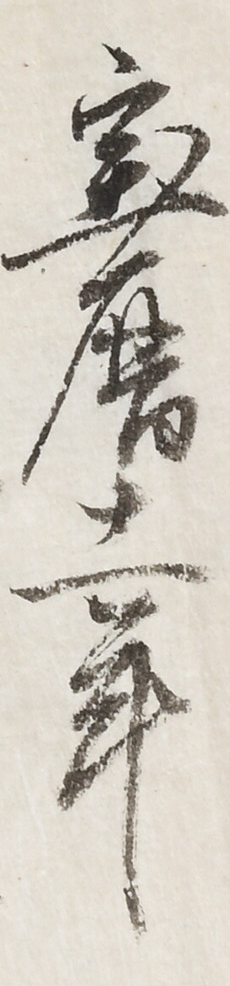宝暦十一年
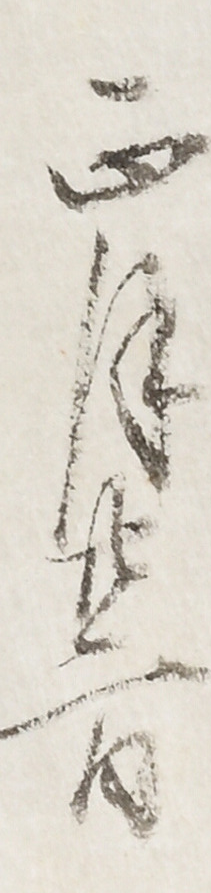正月廿二日
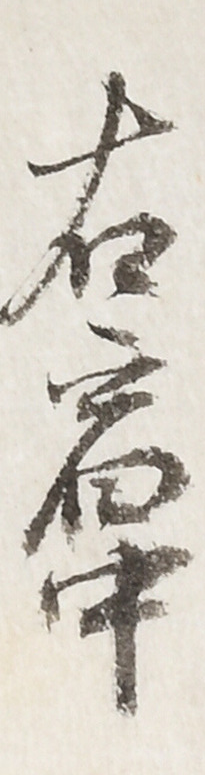右宿中
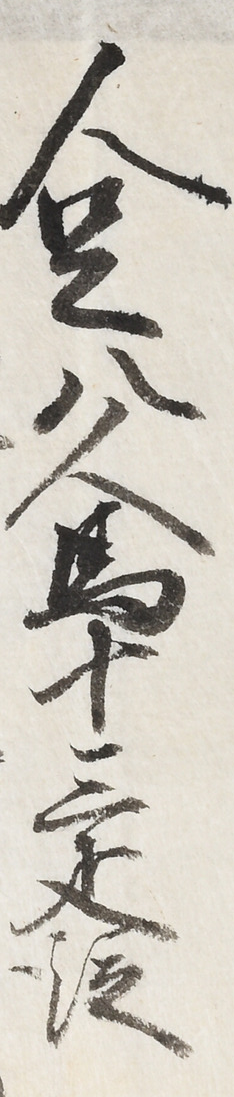人足八人馬十三疋従
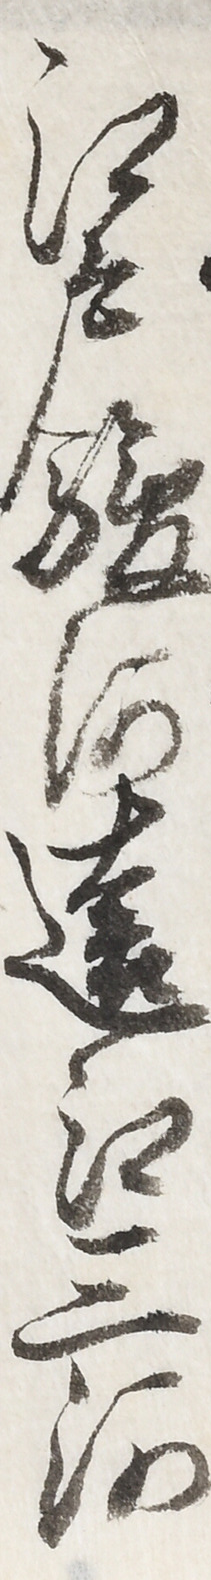江戸駿河遠江三河
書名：御巡見様御先觸之写
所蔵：伊那市立高遠町図書館・合同会社AMANE
